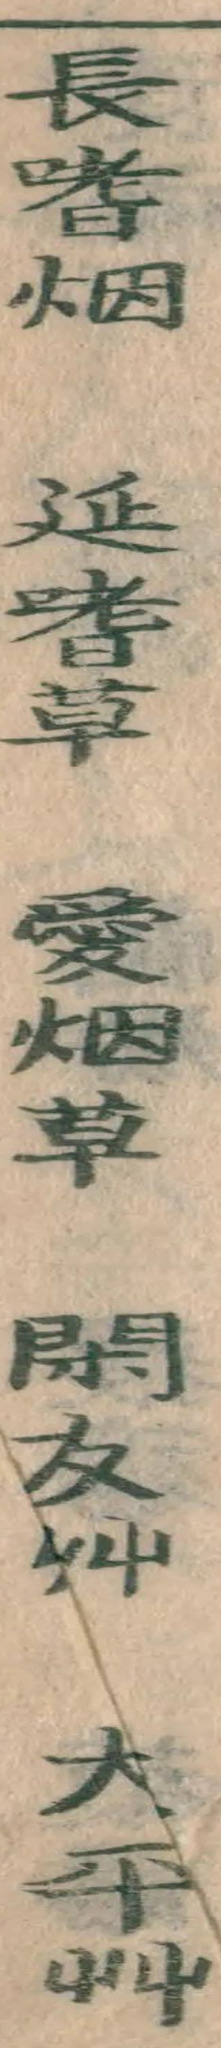長嗜烟延嗜草愛烟草閑友草大平草
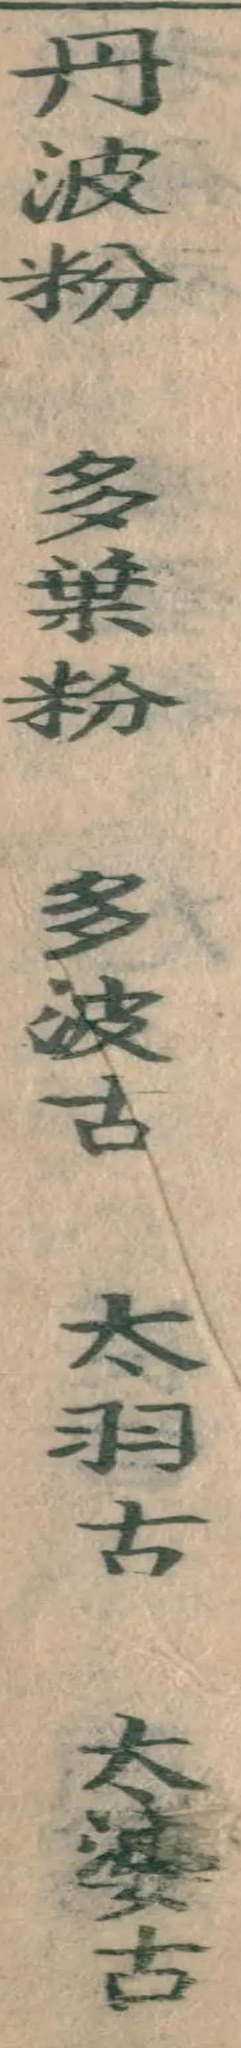丹波粉多葉粉多波古太羽古太婆古

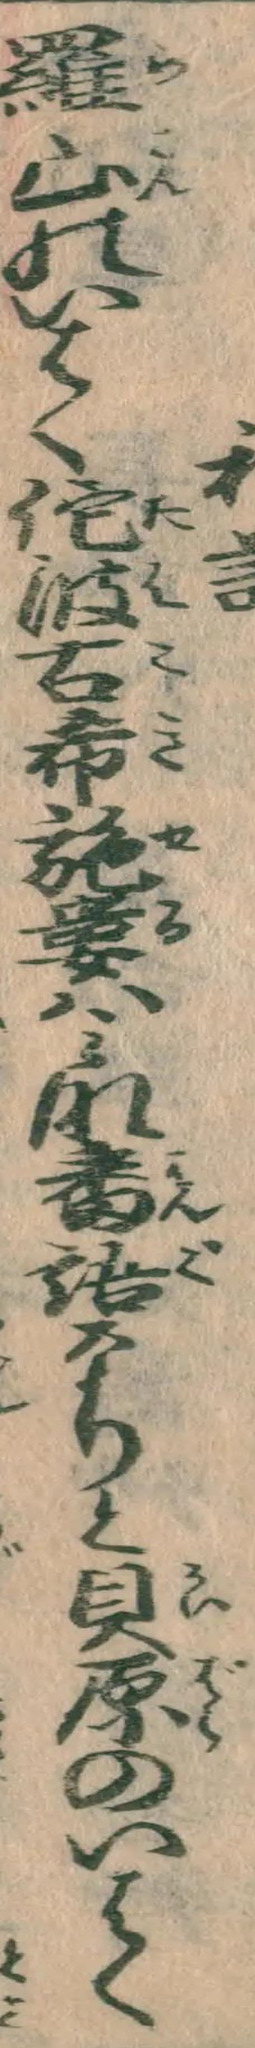羅山のいはく佗波古希施婁はみな番語なりと貝原のいはく
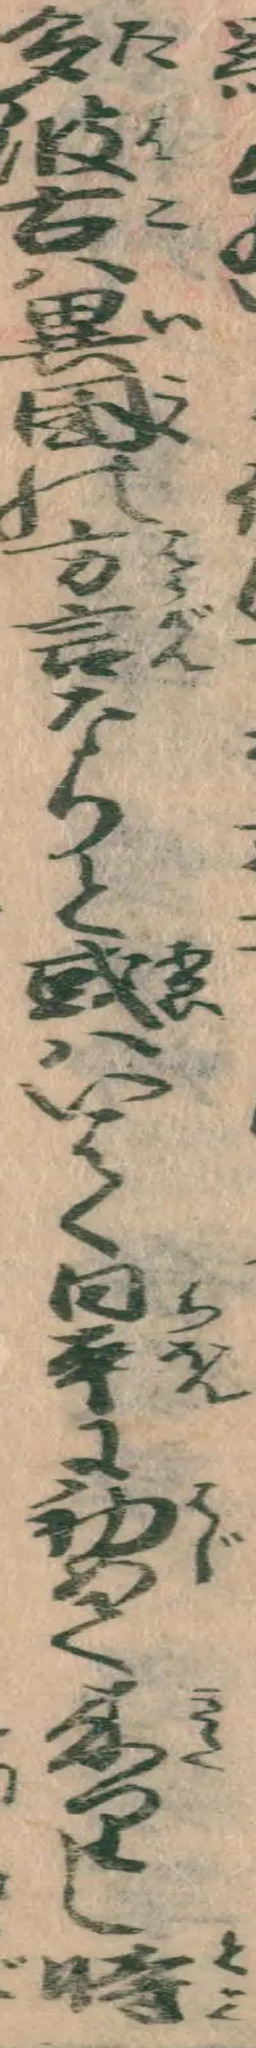多波古は異国の方言なりと或はいはく日本に初めて来りし時
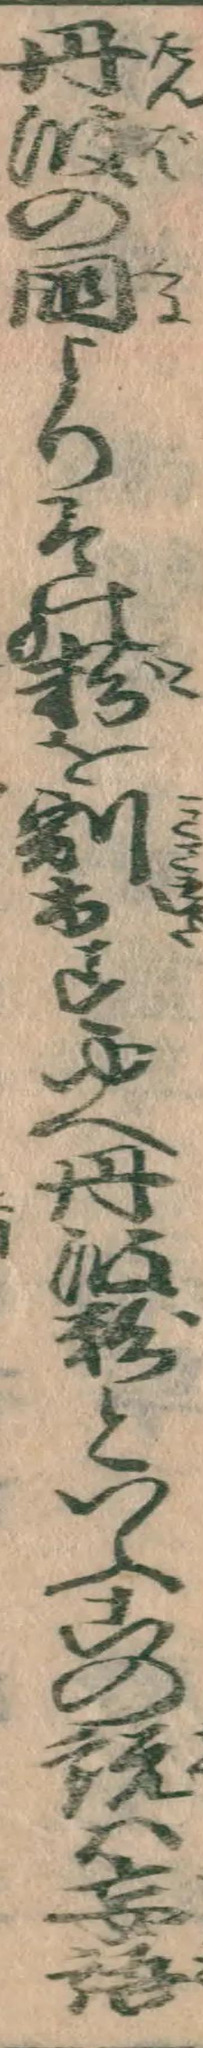丹波の国よりその粉を割出すゆへ丹波粉といふこの説は妄語
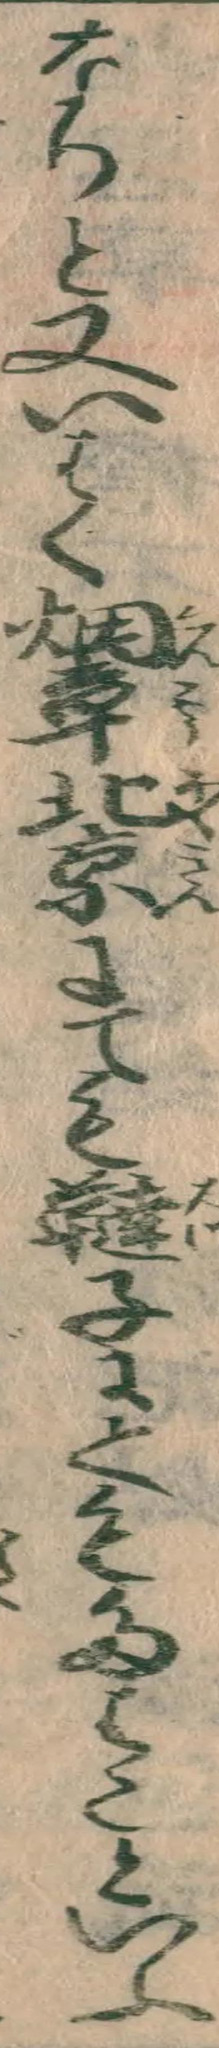なりと又いはく烟草北京にても韃子にてもたはこといふ
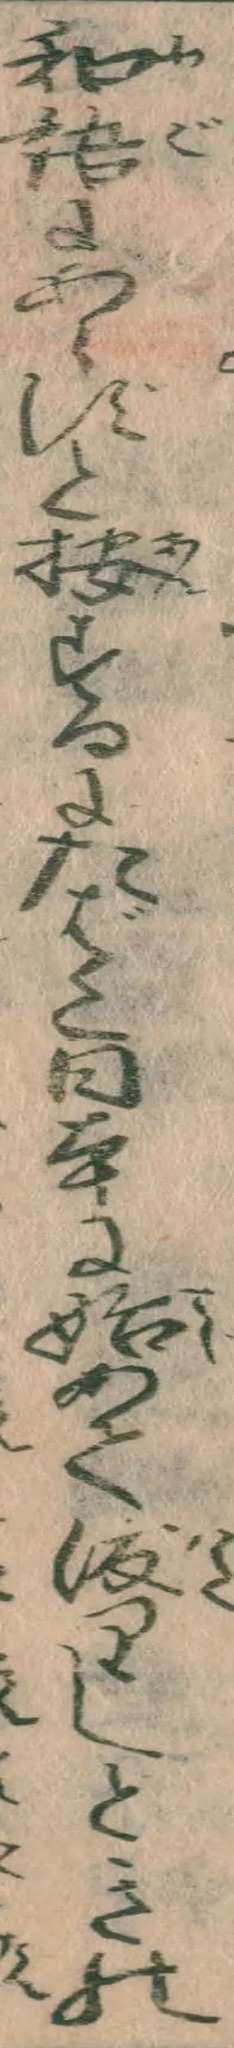和語にあらずと按するにたばこ日本に始めて渡りしときの
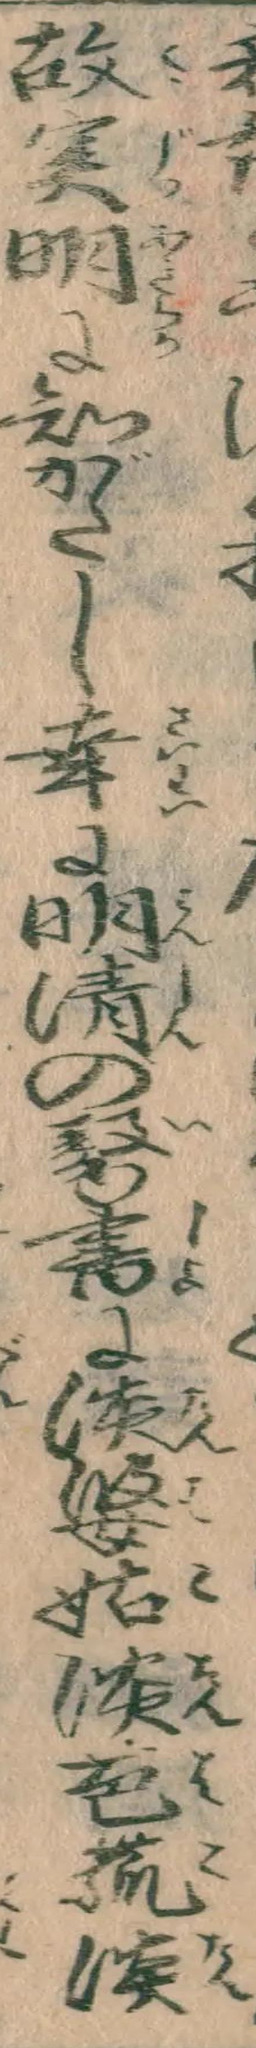故実明に知がたし幸に明清の医書に淡婆姑淡芭菰淡
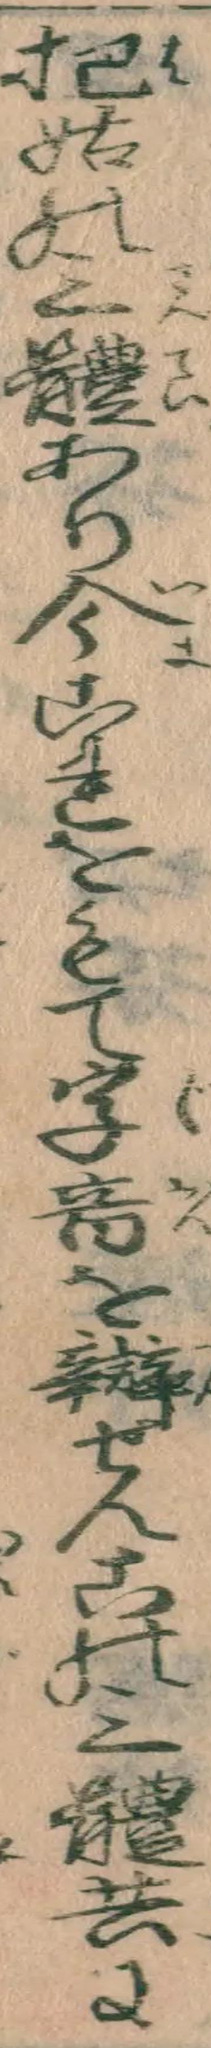把姑の三体あり今これをもて字音を弁せんこの三体共に
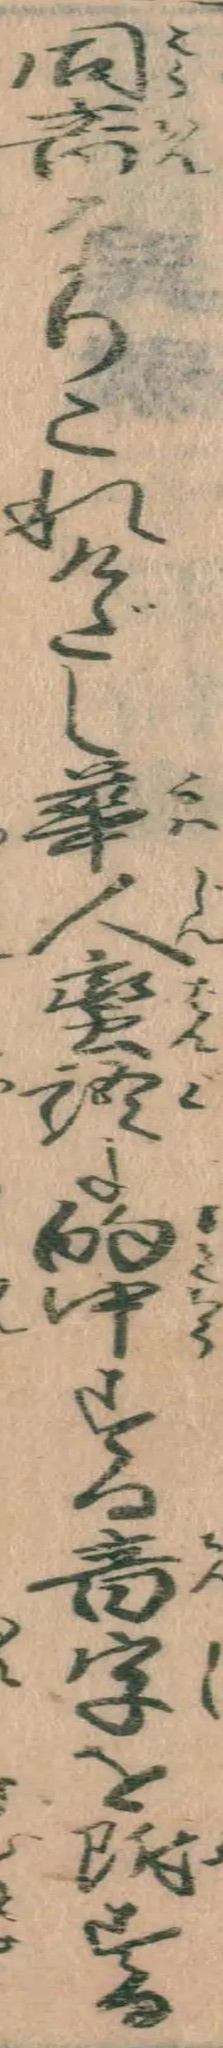同音なりこれけだし華人蛮語に的中する音字を附する
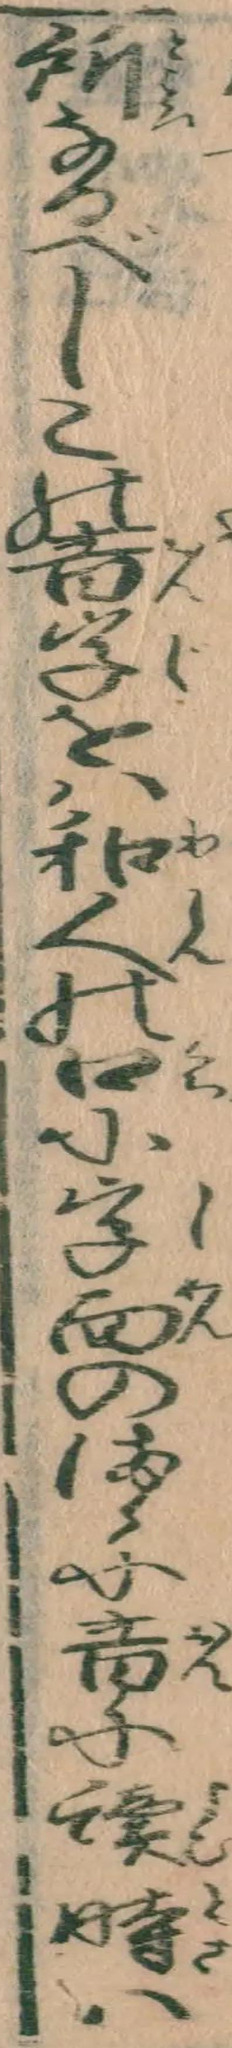所なるべしこの音字をは和人の口に字面のまヽに音に読時は
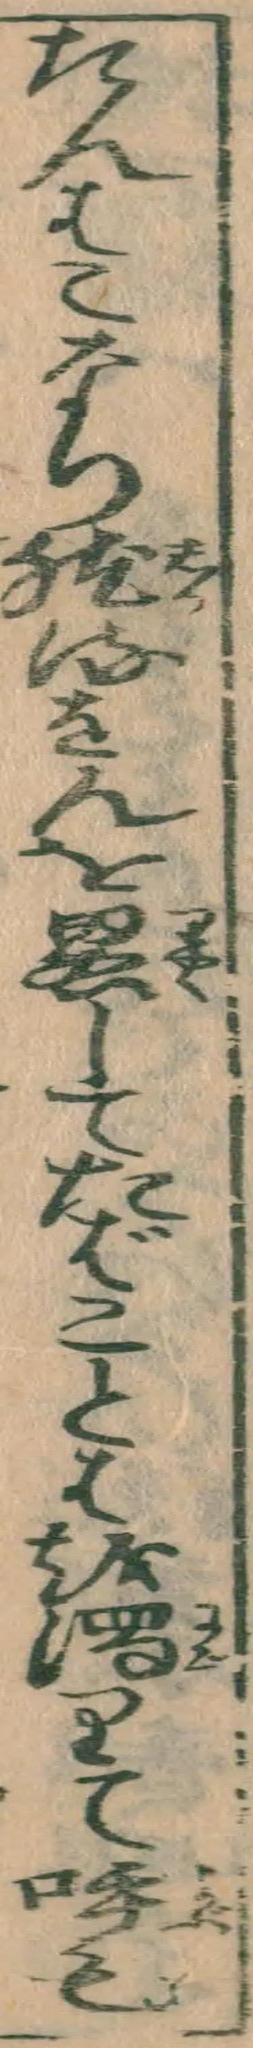たんはこなり然るをんを略してたばことはを濁りて呼も
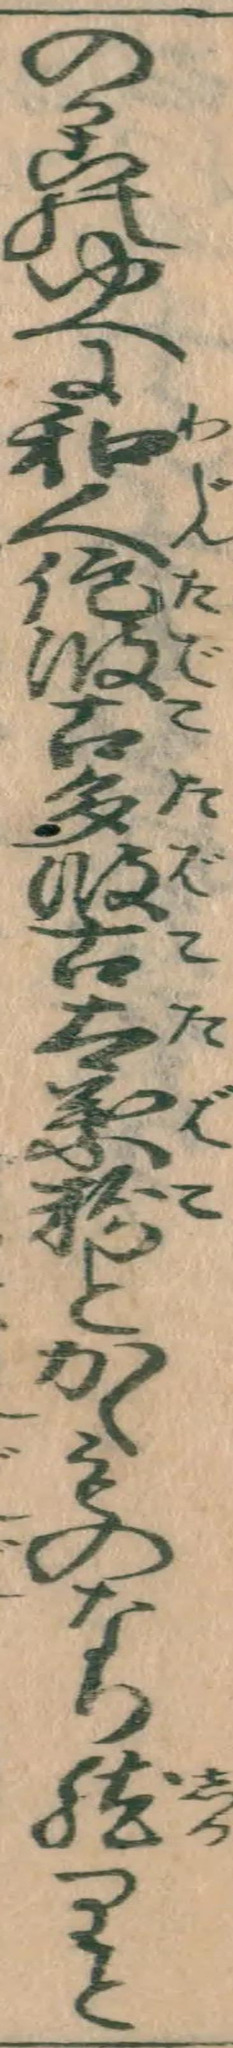のかこのゆへに和人侘波古多波古太葉粉とかくものなり然りと
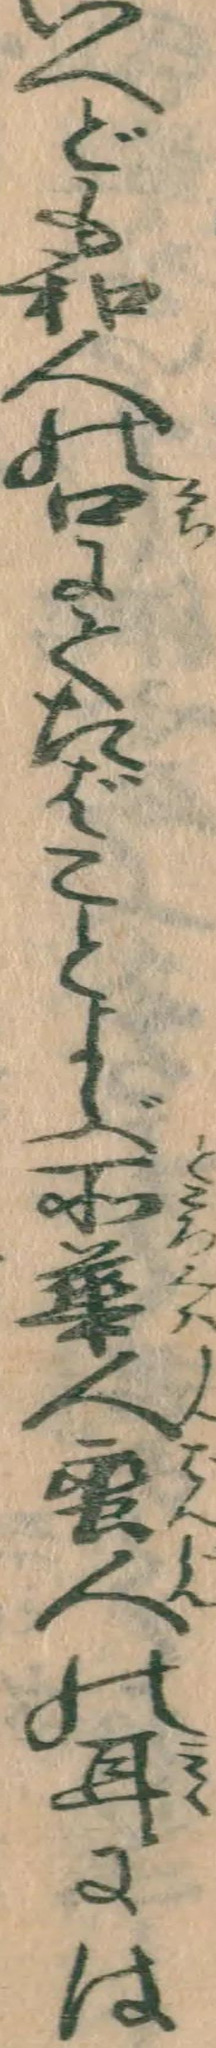いへども和人の口にてたばことよぶ所華人蛮人の耳には
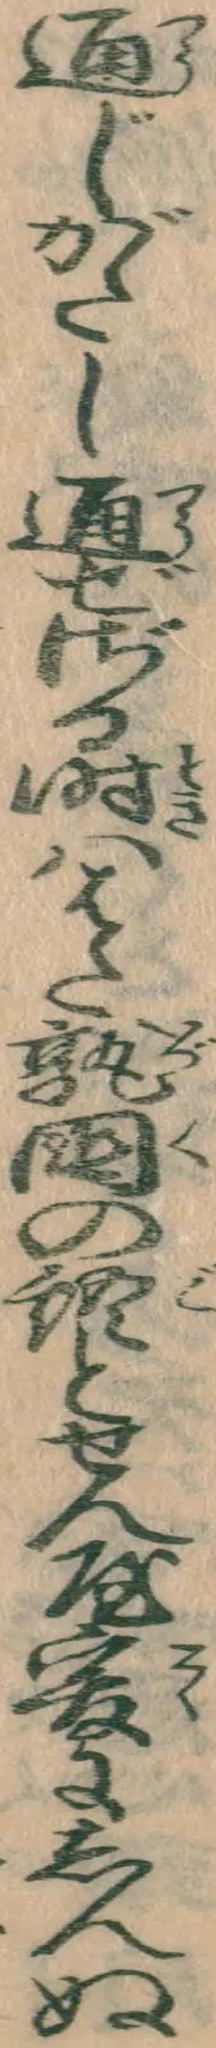通じがたし通ぜざる時ははた孰国の語とせんや爰にしんぬ
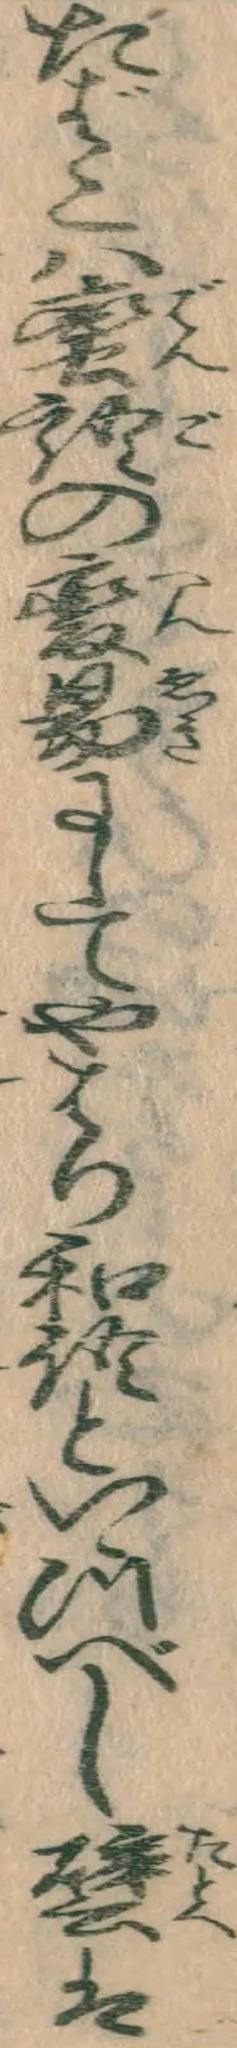たばこは蛮語の変易にしてやはり和語といゝつべし譬は
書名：煙草記
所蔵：国立国会図書館 National Diet Library, JAPAN
